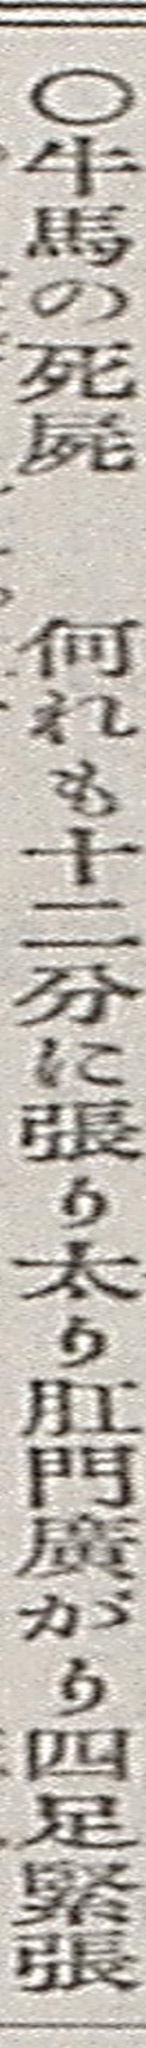○牛馬の死屍何れも十二分に張り太り肛門広がり四足緊張
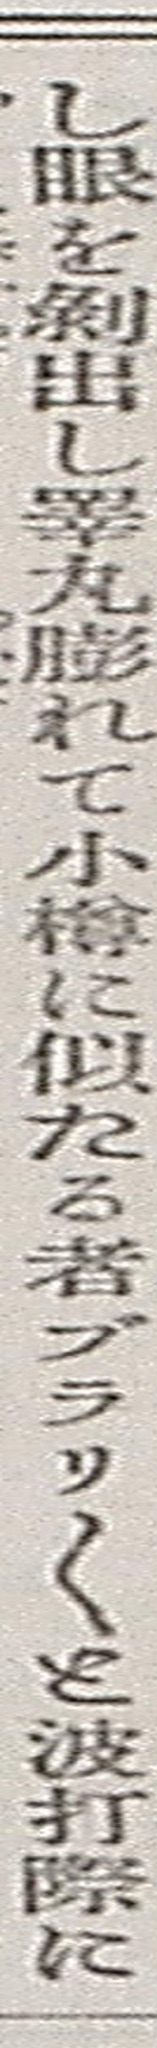し眼を剥出し睾丸膨れて小樽に似たる者ブラリ〳〵と波打際に
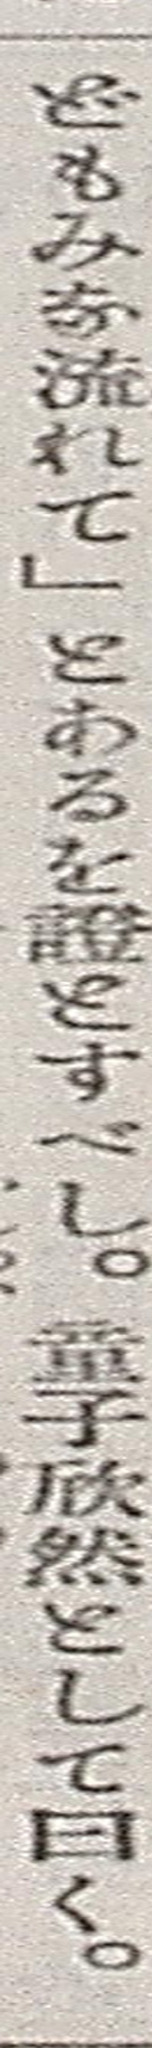どもみな流れて」とあるを証とすべし。童子欣然として曰く。
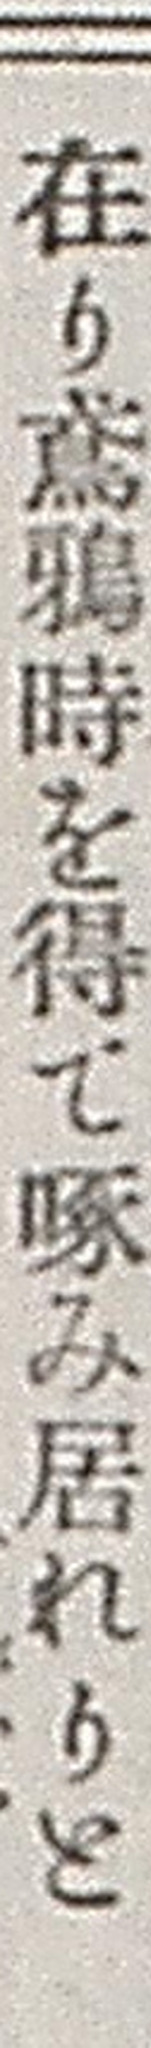在り鳶鴉時を得て啄み居れりと
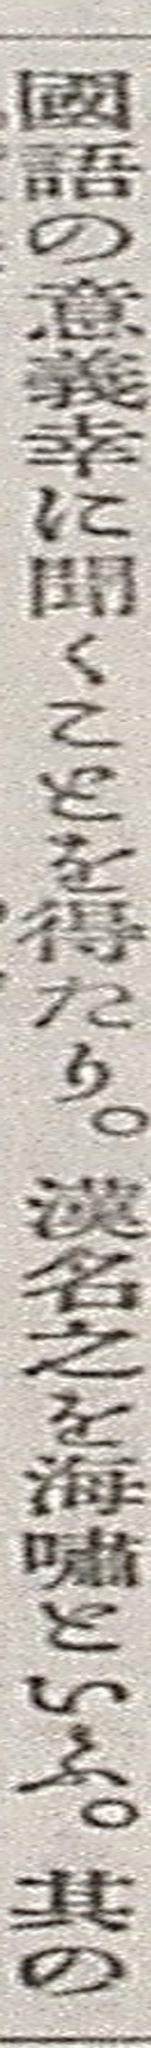国語の意義幸に聞くことを得たり。漢名之を海嘯●●といふ。其の
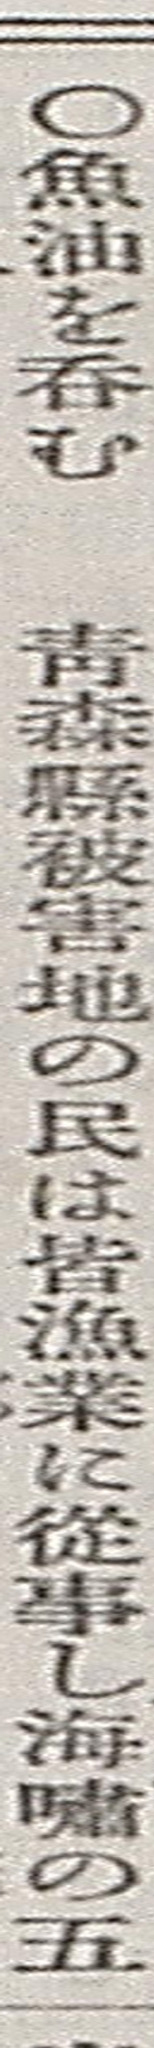○魚油を呑む青森県被害地の民は皆漁業に従事し海嘯の五
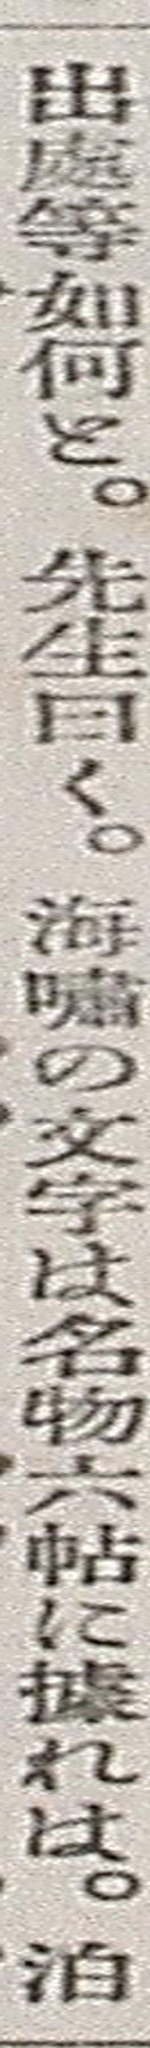出処等如何と。先生曰く。海嘯●●の文字は名物六帖に拠れは。泊
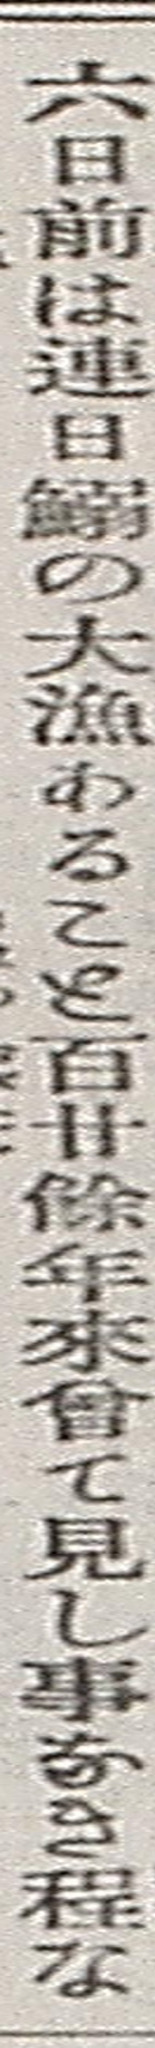六日前は連日鰯の大漁あること百廿余年来曾て見し事なき程な
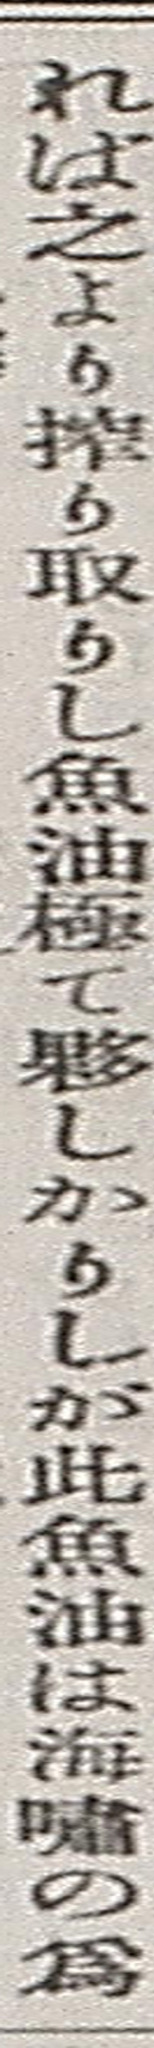れば之より搾り取りし魚油極て夥しかりしが此魚油は海嘯の為
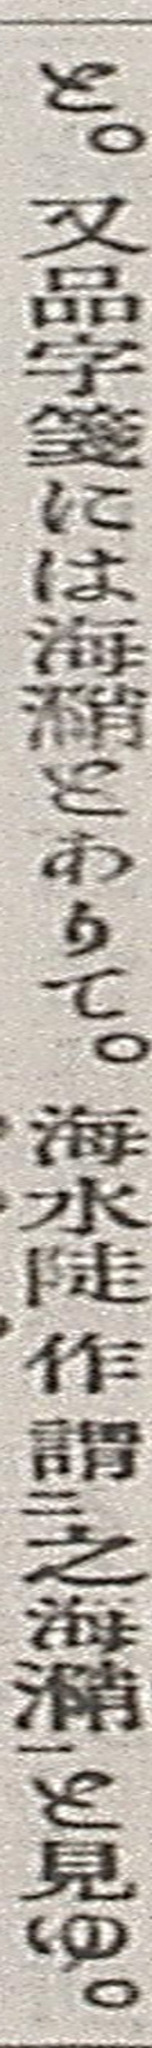と。又品字編には海𣹝とありて。海水陡作謂之海𣹝と見ゆ。
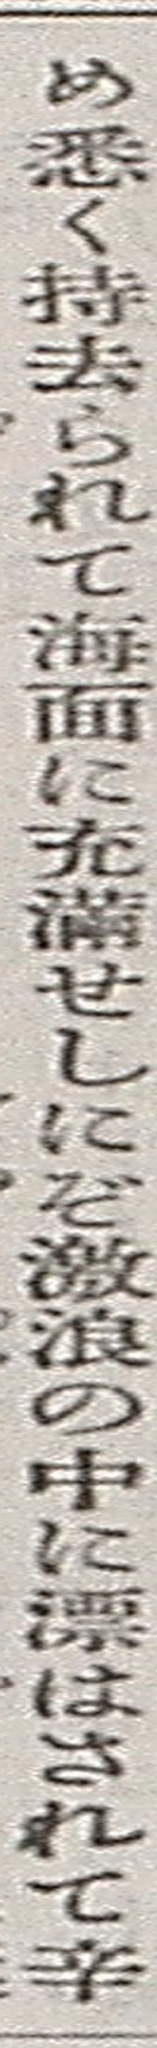め悉く持去られて海面に充満せしにぞ激浪の中に漂はされて辛
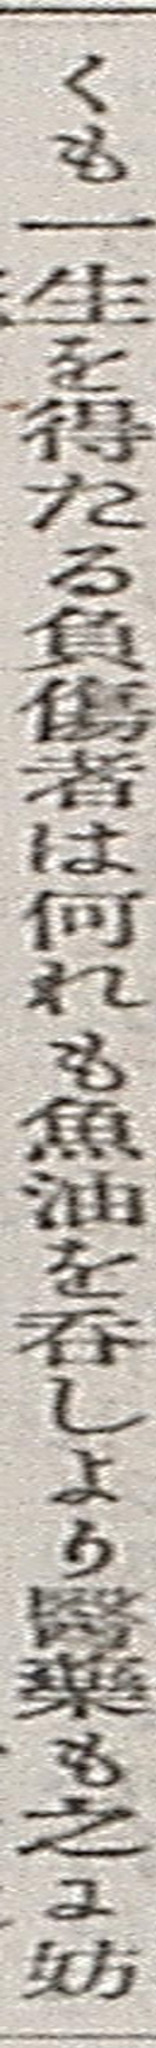くも一生を得たる負傷者は何れも魚油を呑しより医薬も之に妨
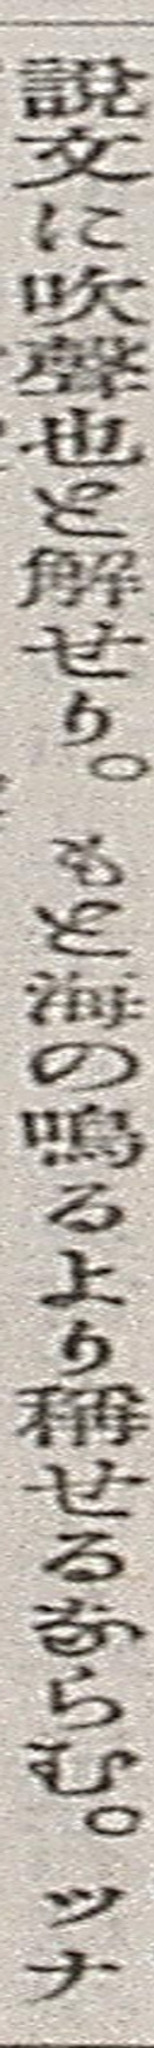説文に吹声也と解せり。もと海の鳴るより称せるならむ。ツナ●●
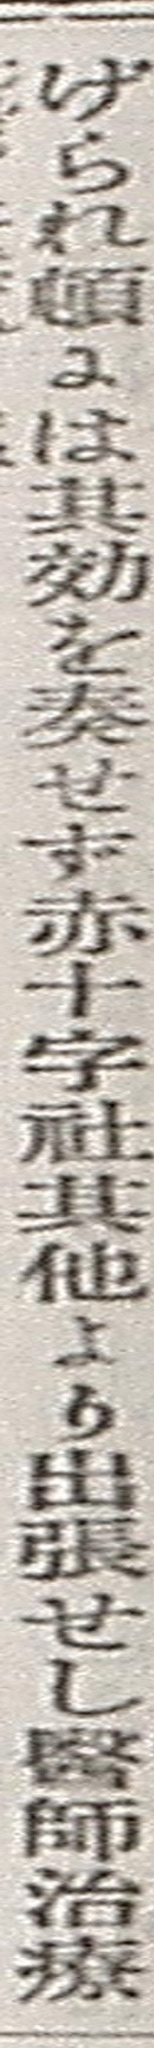げられ頓には其効を奏せず赤十字社其他より出張せし医師治療
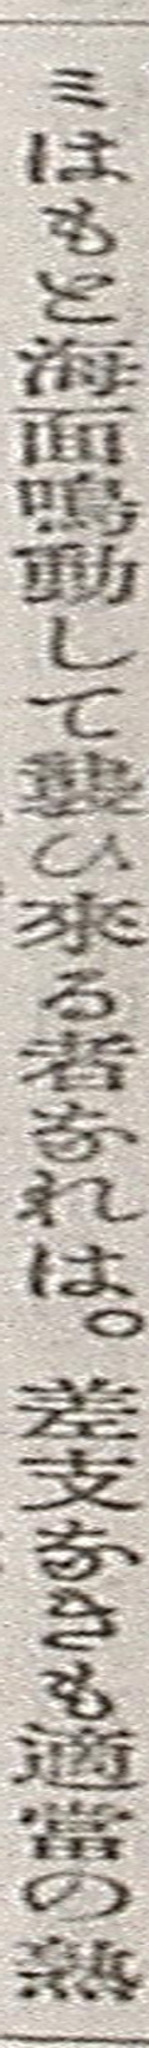ミ●はもと海面鳴動して襲ひ来る者なれは。差支なきも適当の熟
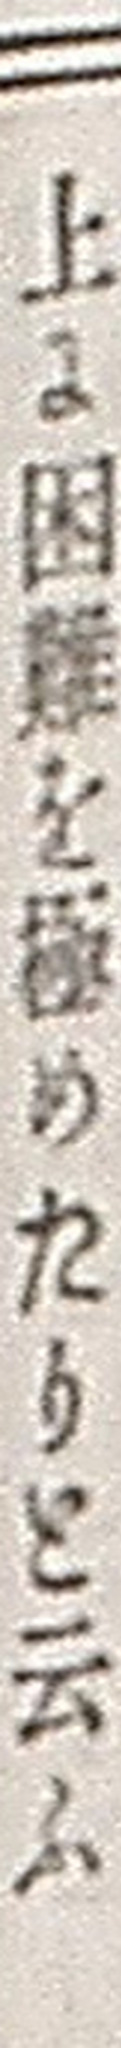上に困難を極めたりと云ふ
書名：風俗畫報臨時増刊第百二十號　大海嘯被害録（下）
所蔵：東京大学地震研究所図書室 Earthquake Research Institute Library, The University of Tokyo, JAPAN
